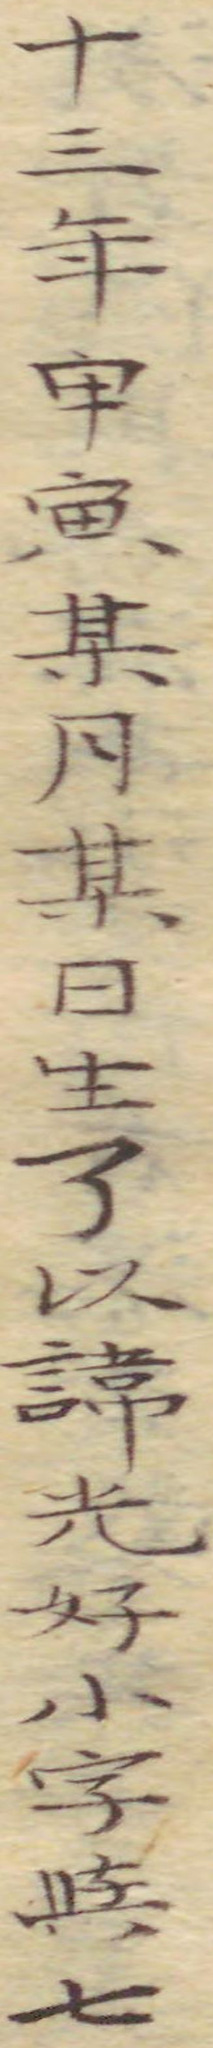十三年甲寅其月某日生了以諱光好小字與七
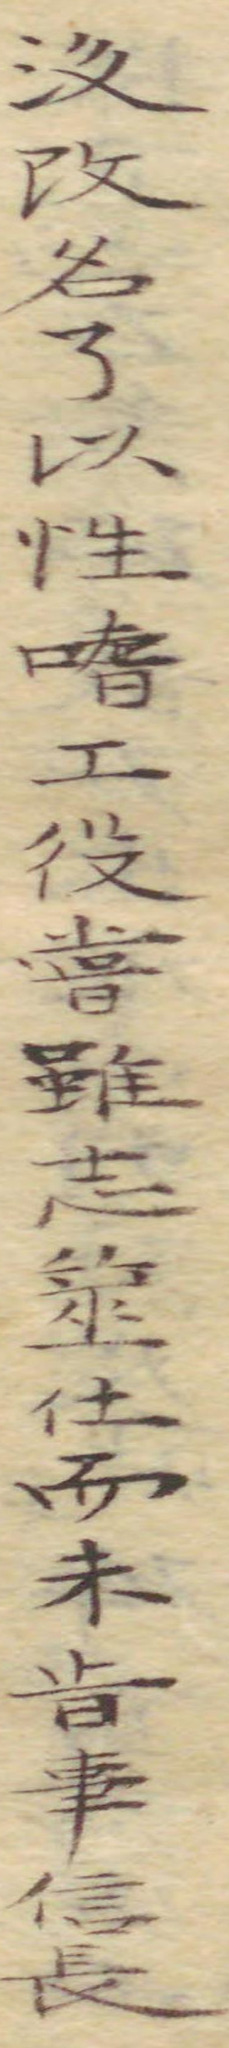没改名了以性嗜工役嘗雖志筮仕而未肯事信長
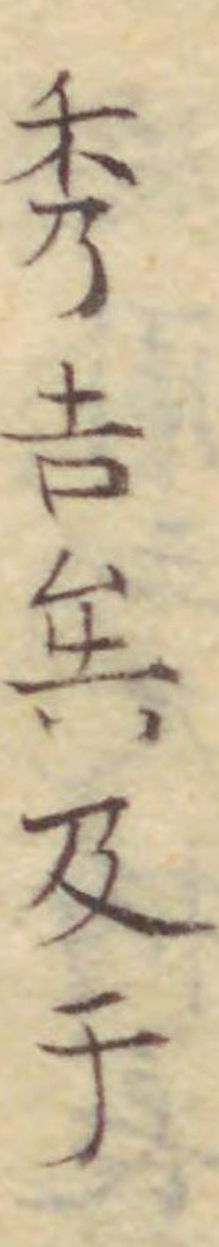秀吉矣及于
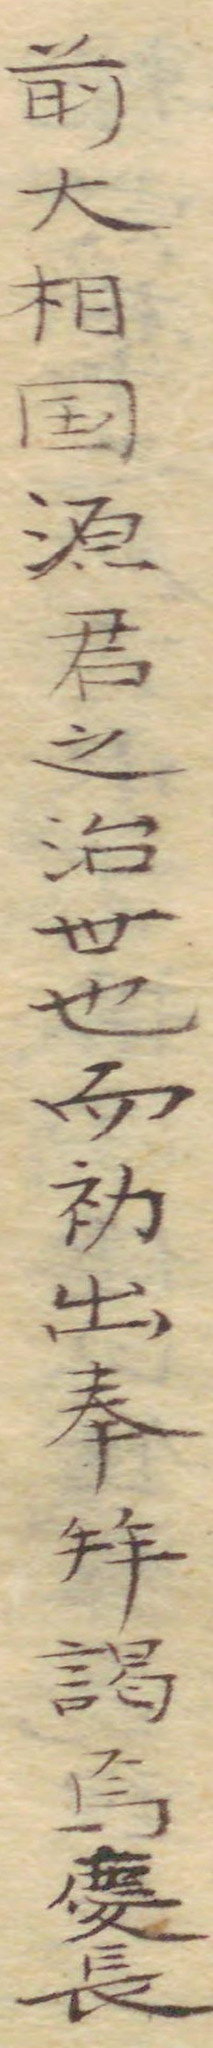前大相国源君之治世也而初出奉拝謁焉慶長
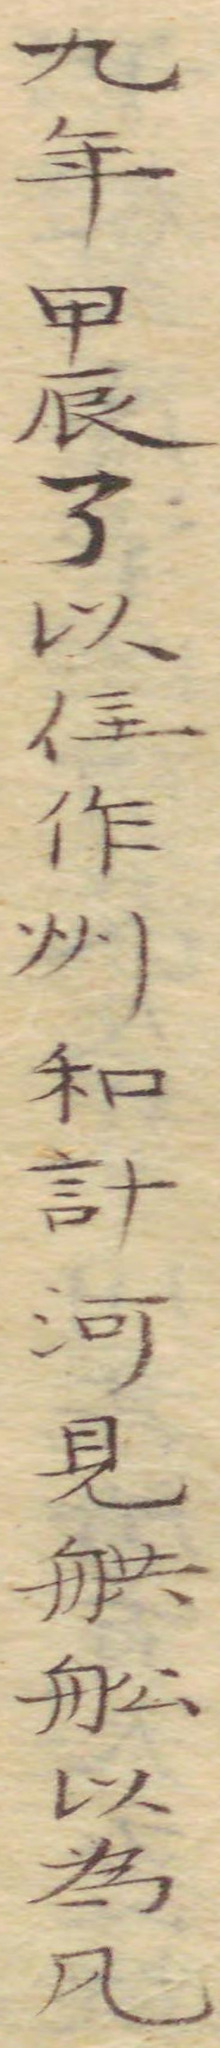九年甲辰了以住作州和計河見舼船以為凡
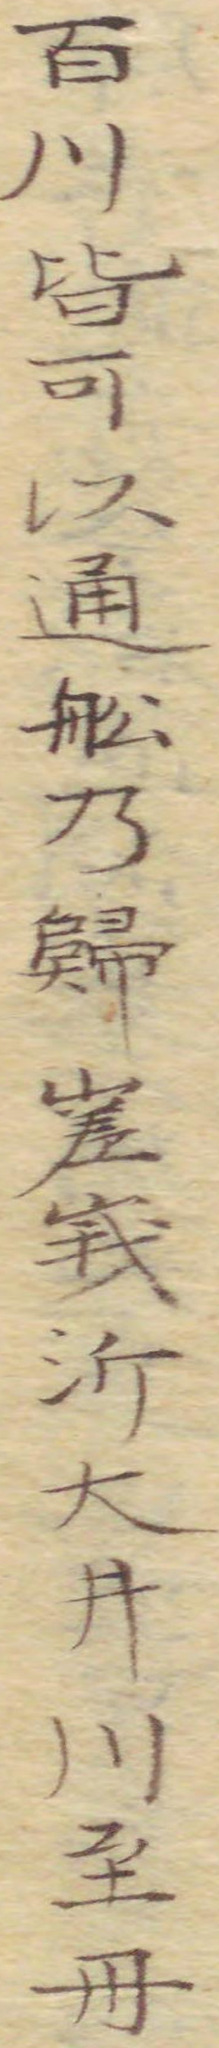百川皆可以通船乃帰嵯峨沂大井川至丹
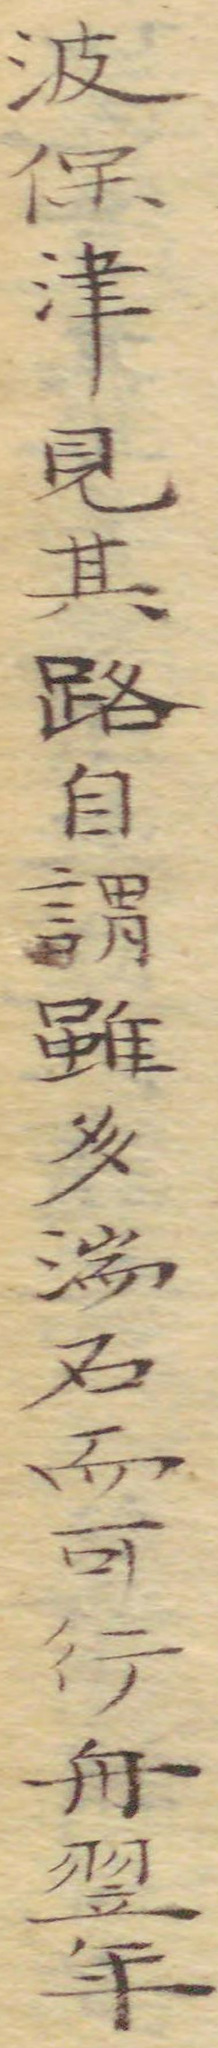波保津見其路自謂雖多湍石而可行舟翌年

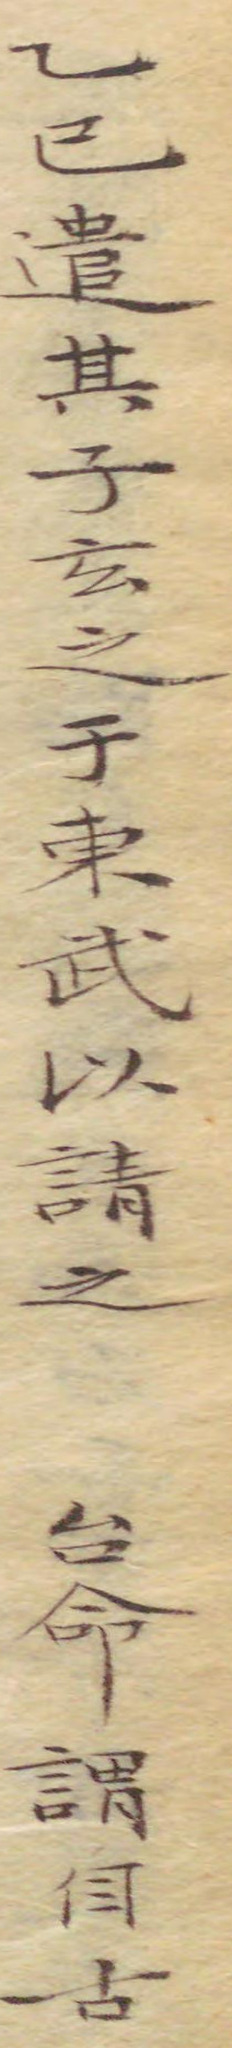乙巳遣其子玄之于東武以請之台命謂自古
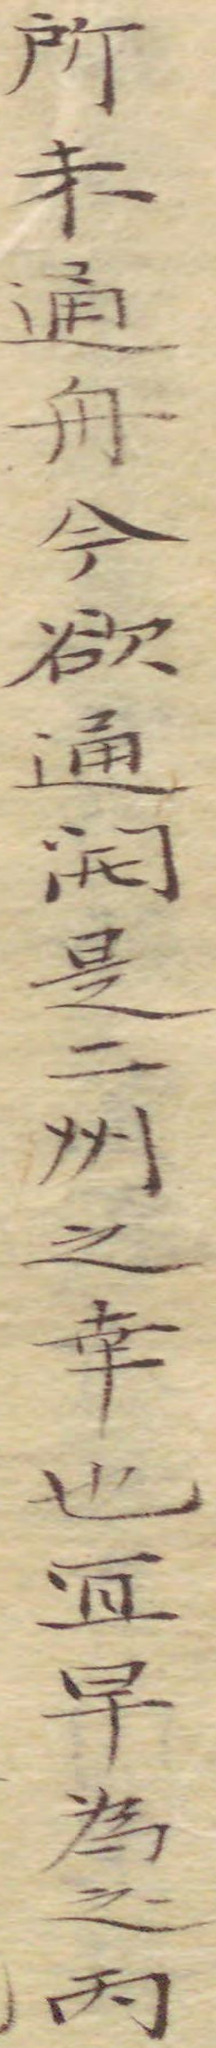所未通舟今欲通開是二州之幸也宜早為之丙
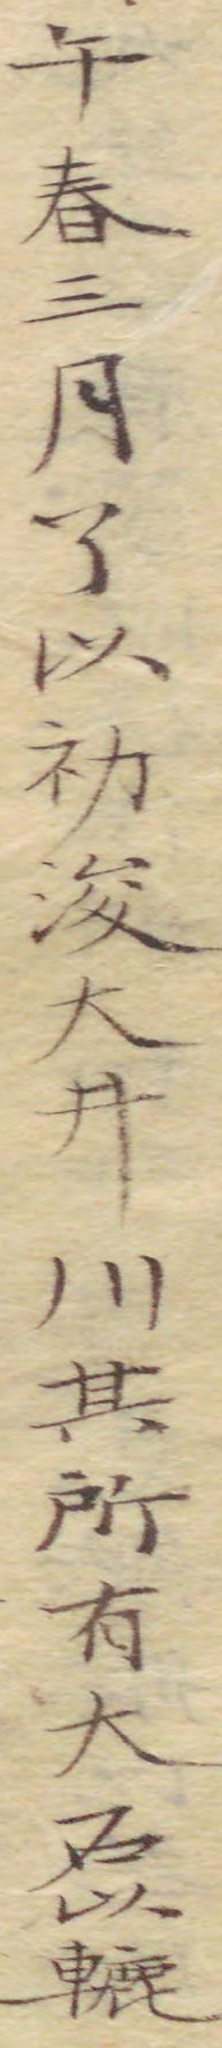午春三月了以初浚大井川其所有大石以轆
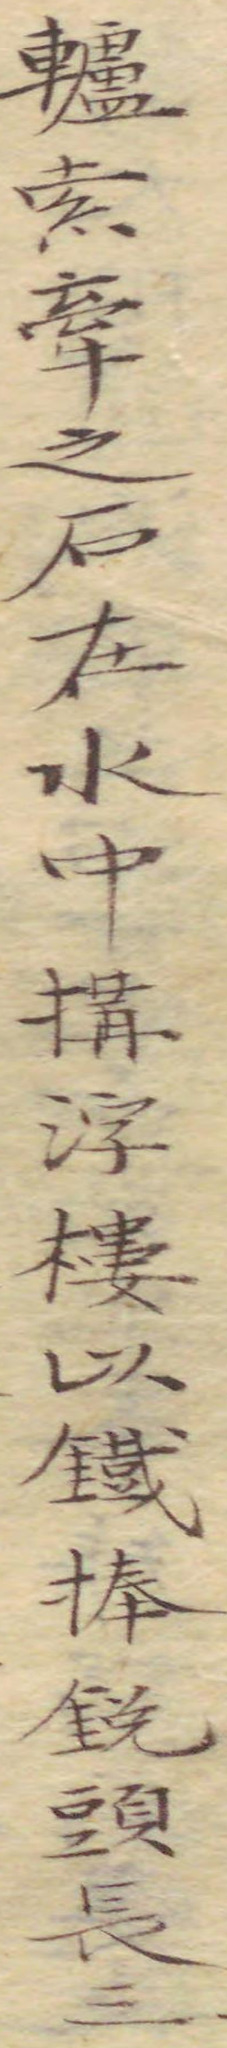轤索牽之石在水中構浮楼以鉄棒鋭頭長三
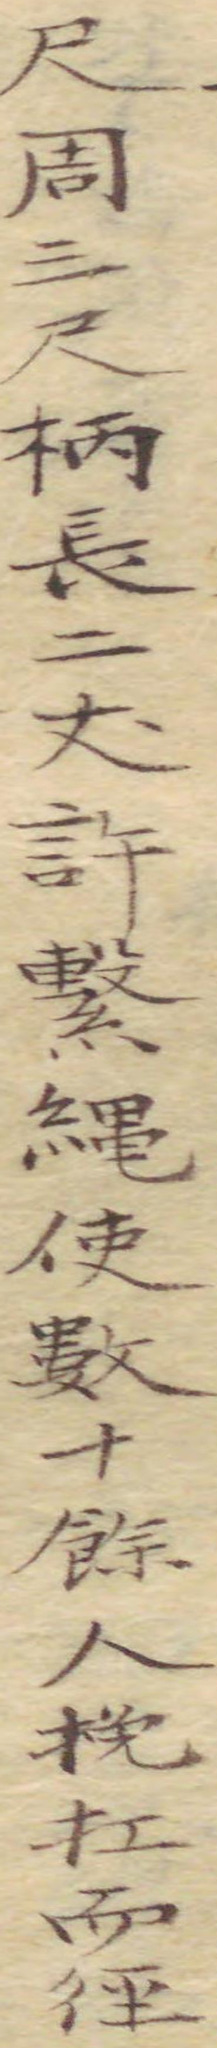尺周三尺柄長二丈許繋縄使数十余人挽扛而径
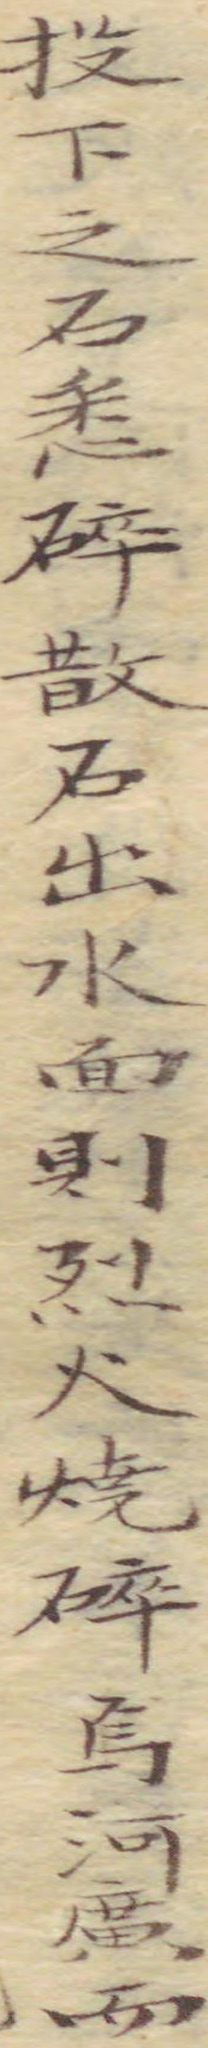投下之石悉砕散石出水面則烈火焼砕焉河広而
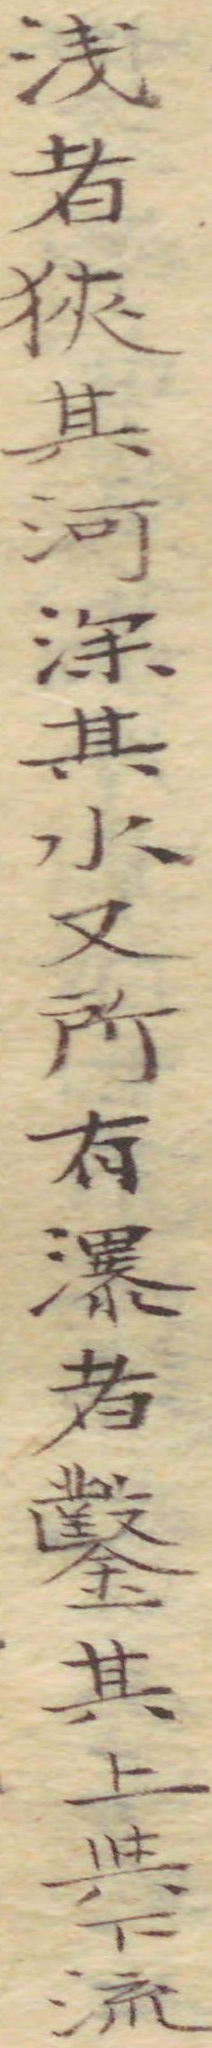浅者挟其河深其水又所有瀑者鑿其上与下流
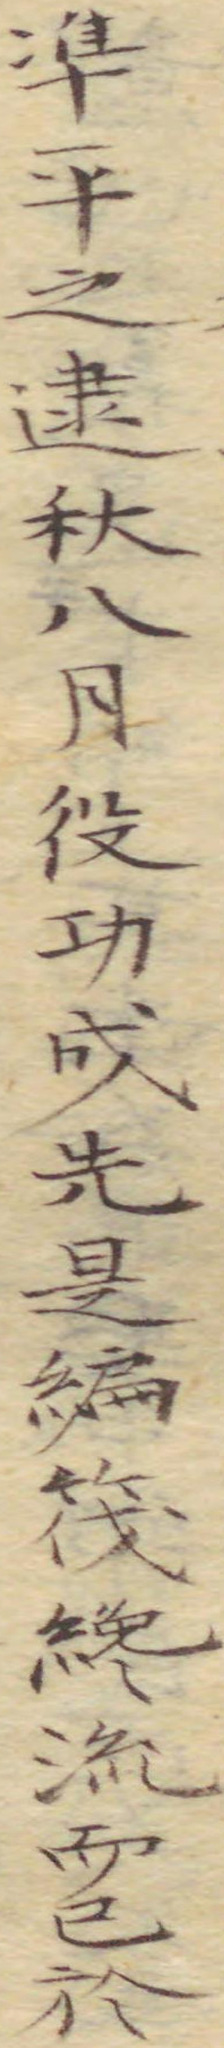準平之逮秋八月役功成先是編筏纔流而已於
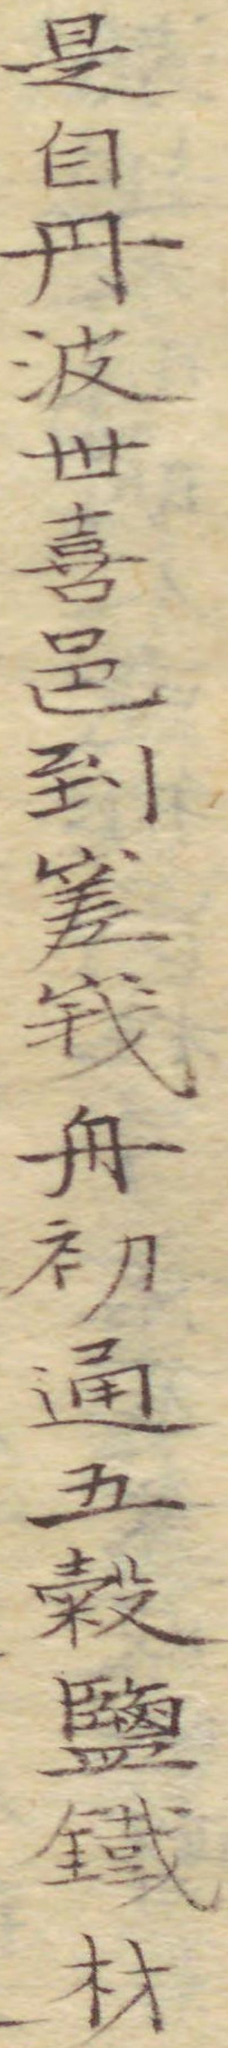是自丹波世喜邑到嵯峨舟初通五穀塩鉄材
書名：鶯宿雑記. 巻263-264
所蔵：国立国会図書館 National Diet Library, JAPAN
